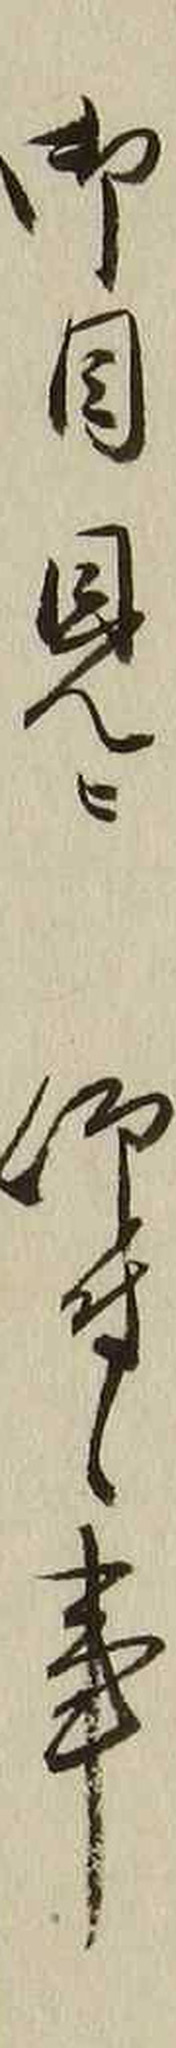御目見被仰付候事
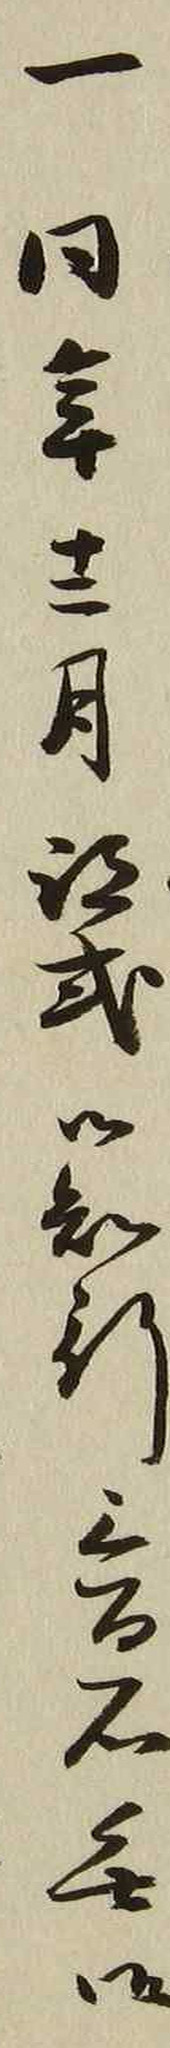一同年十二月跡式御知行三百石無御
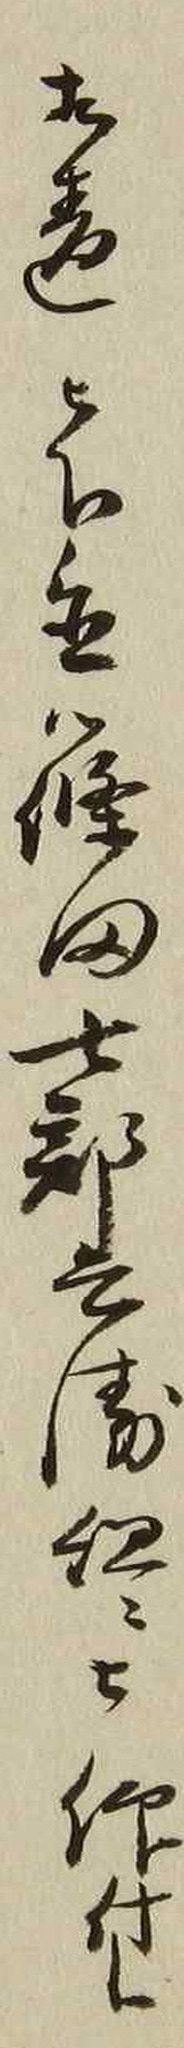相違被下置篠田七郎兵衛組ニ被仰付候
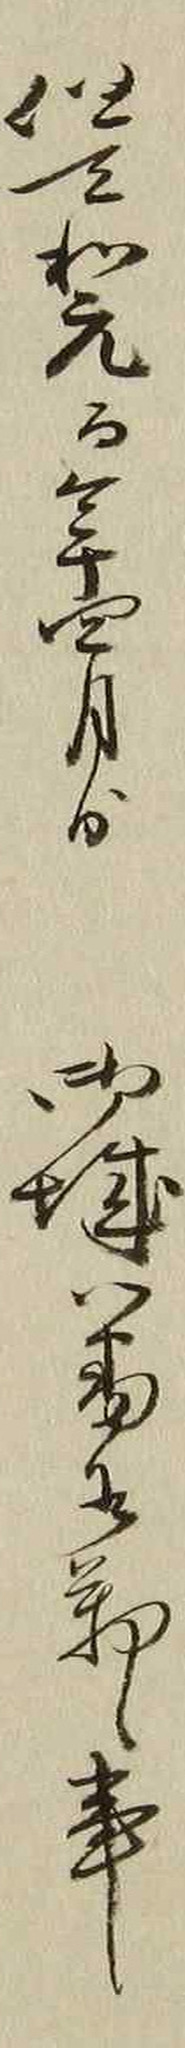但天和元酉年四月ゟ御城御番相勤候事
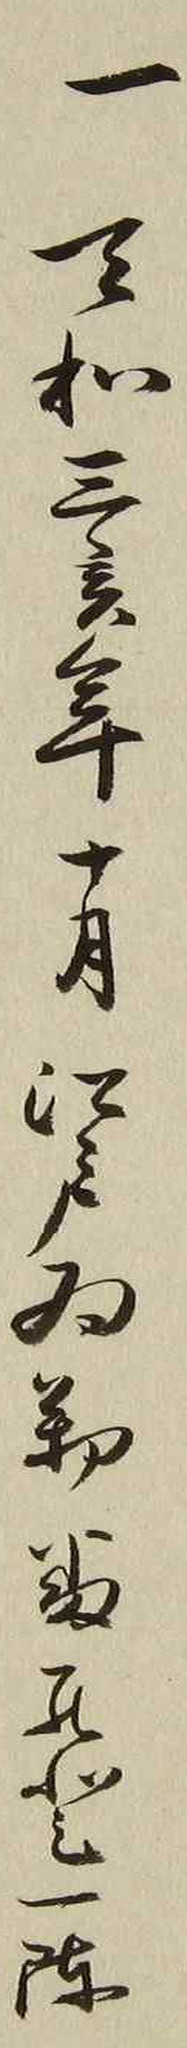一天和三亥年十月江戸為勤番罷登一陣
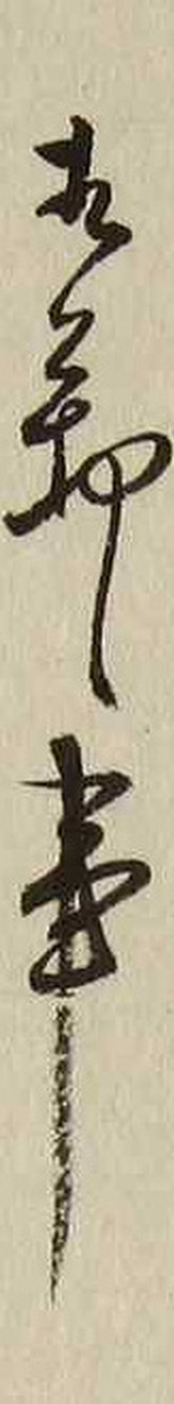相勤候事
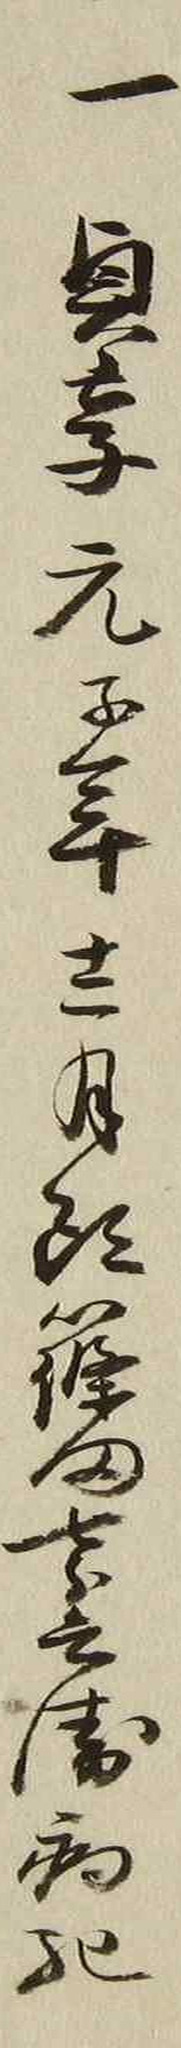一貞享元子年十二月頭篠田七郎兵衛病死
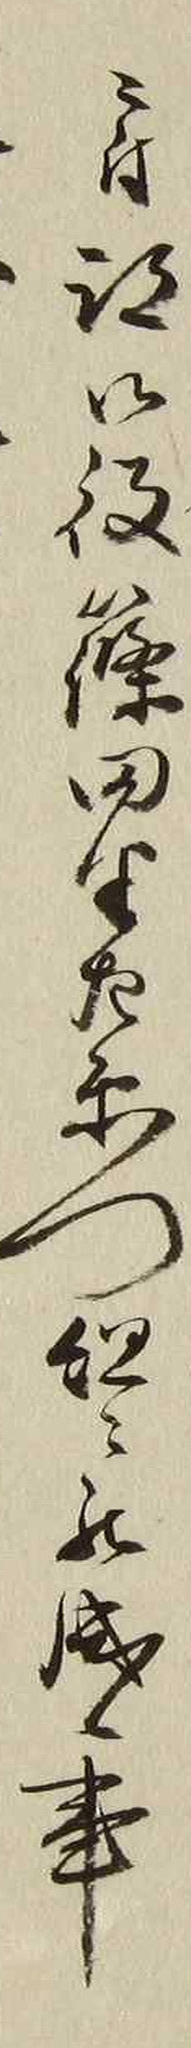ニ付跡御役篠田半左衛門組ニ罷成候事
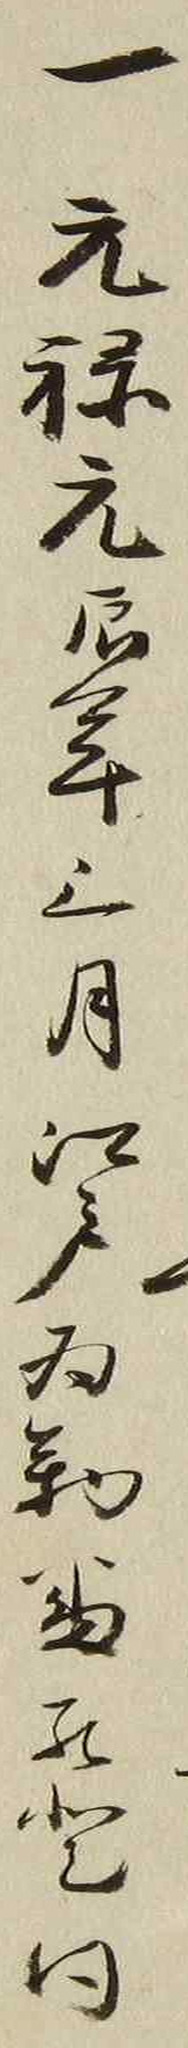一元禄元辰年三月江戸為勤番罷登同
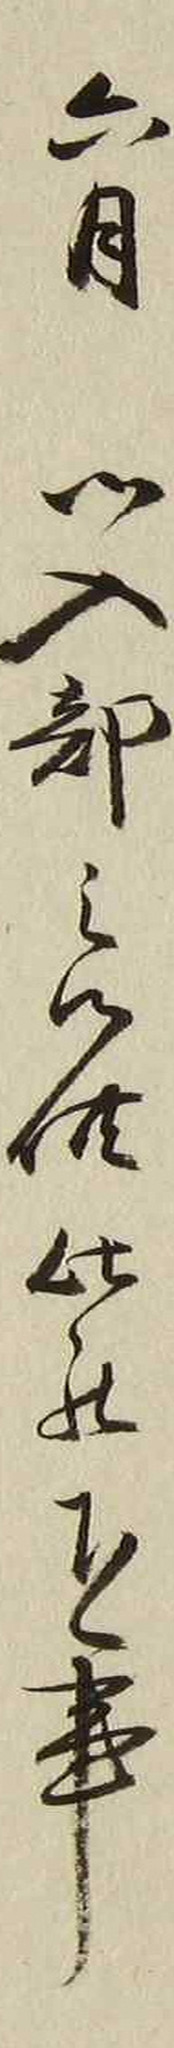六月御入部之御供仕罷下候事
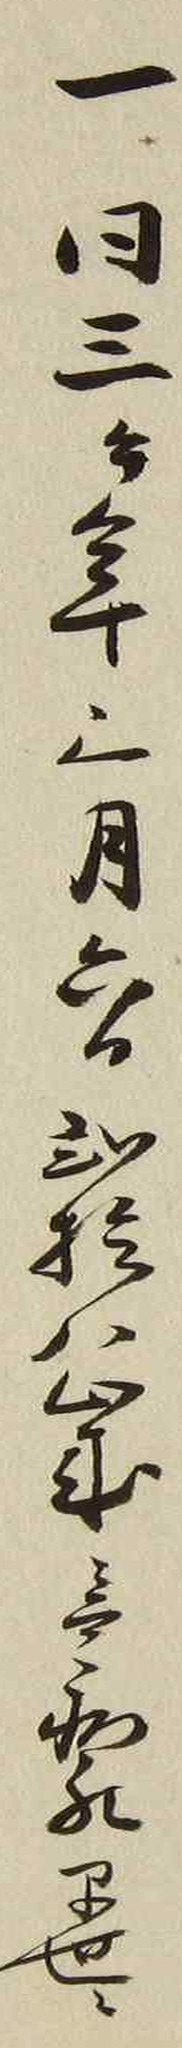一同三午年三月六日弐拾八歳ニ而病死早世ニ
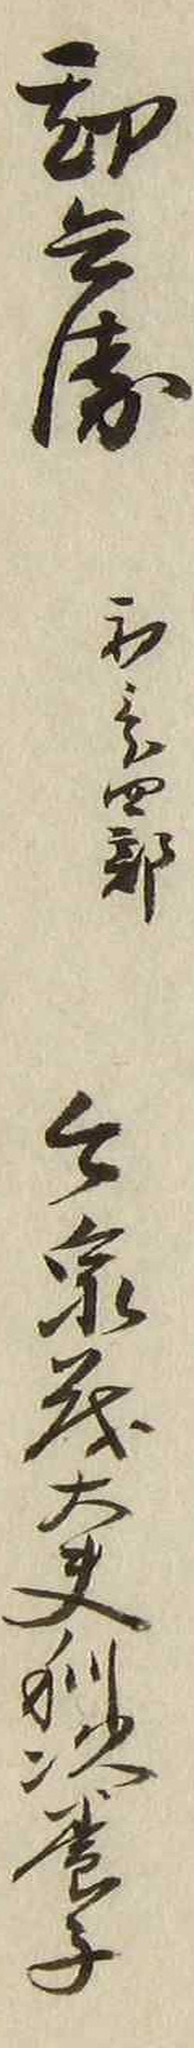勘兵衛初三郎四郎今泉茂大夫利次養子

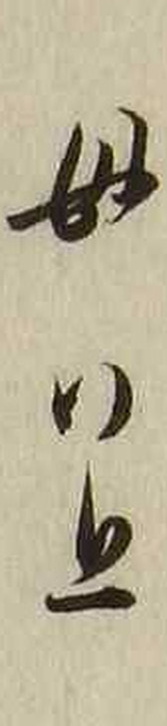母同上
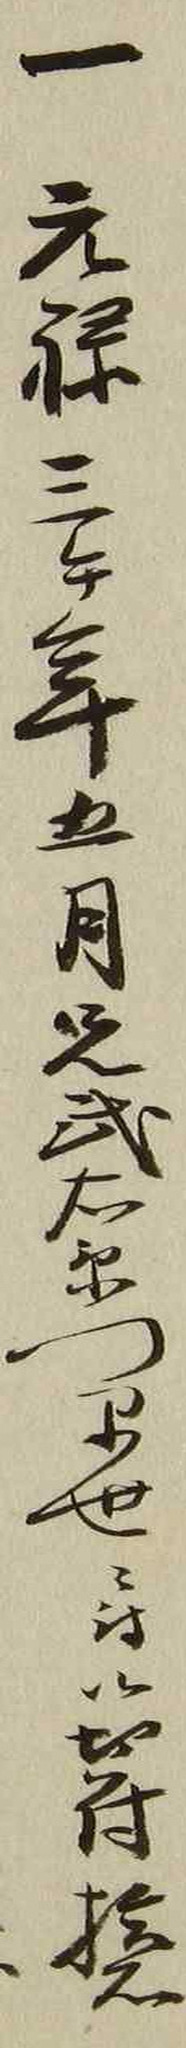一元禄三午年五月兄武右衛門早世ニ付御切符拾石
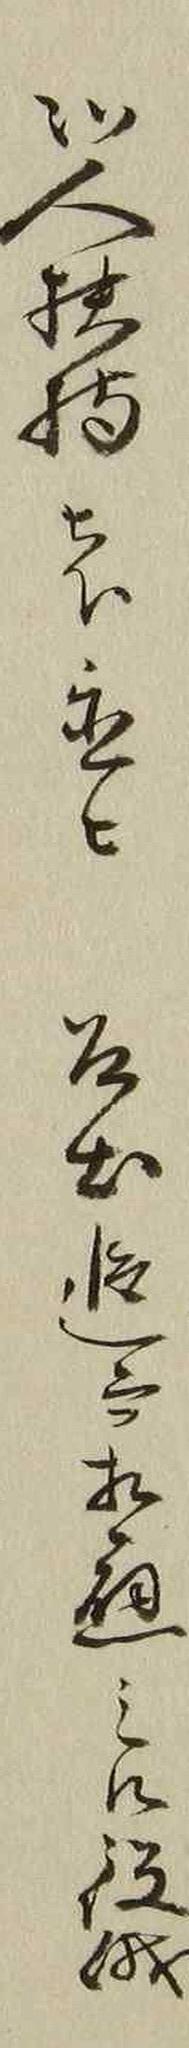弐人扶持被下置被召出追而相応之御役儀
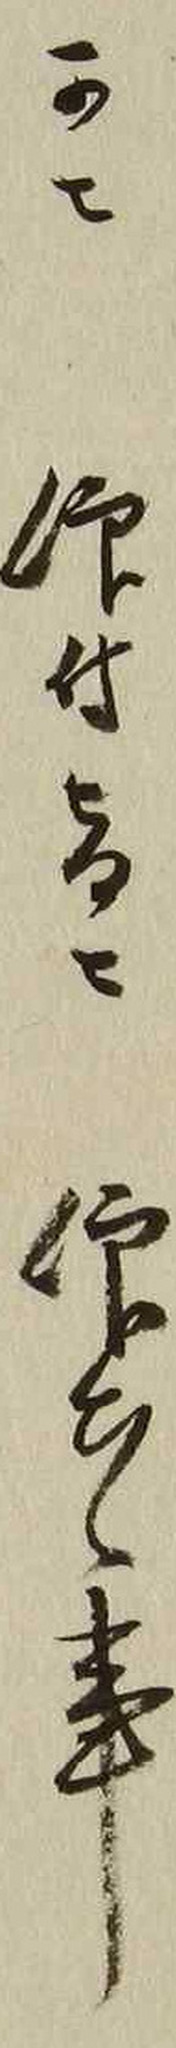可被仰付旨被仰出候事
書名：諸士系譜　巻之288　さ之部20
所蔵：会津若松市立会津図書館
